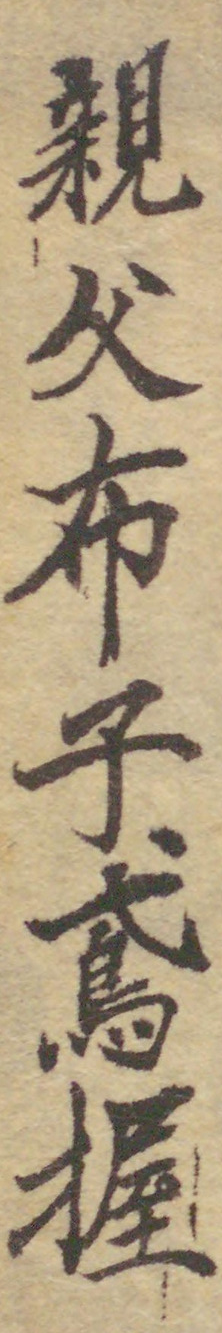親父布子鳶握

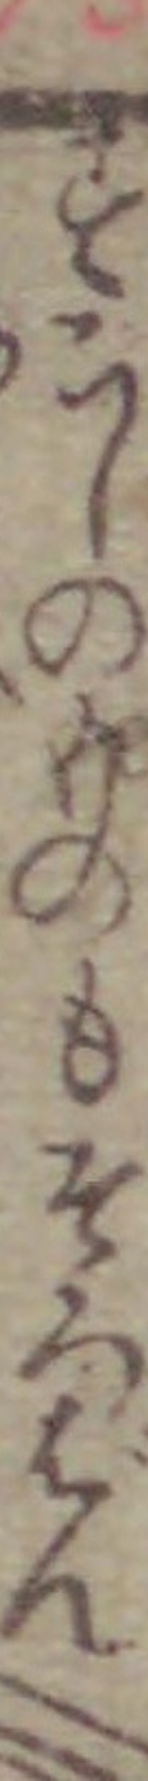すこしのものもそろばん

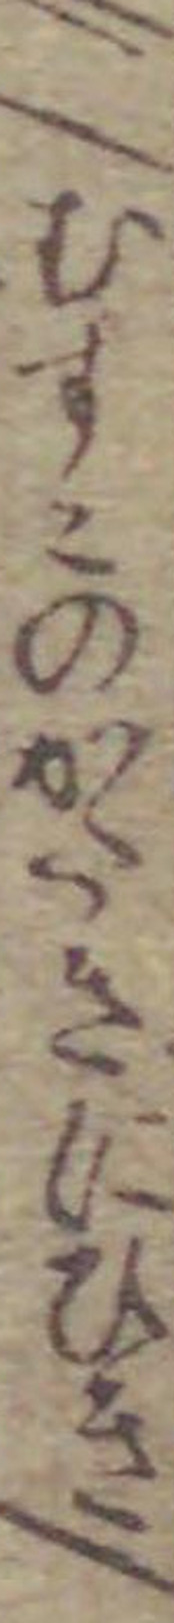むすこのかたきにひき
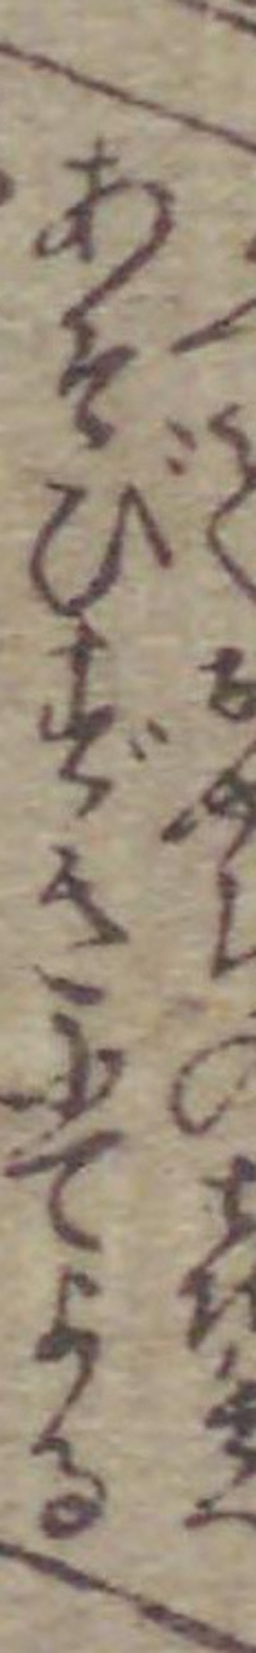あそびずきにてよる
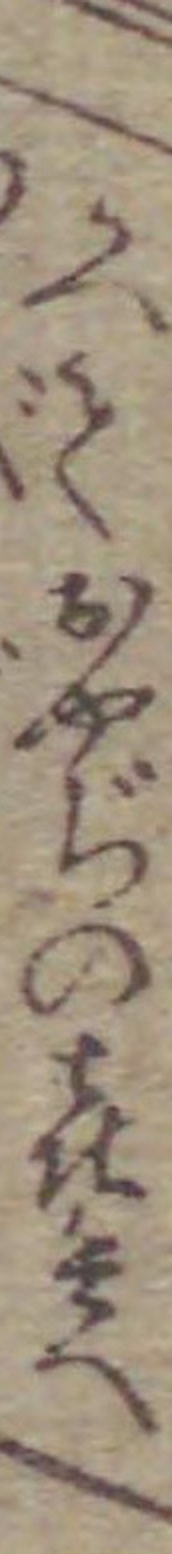かえておやぢの喜兵へ
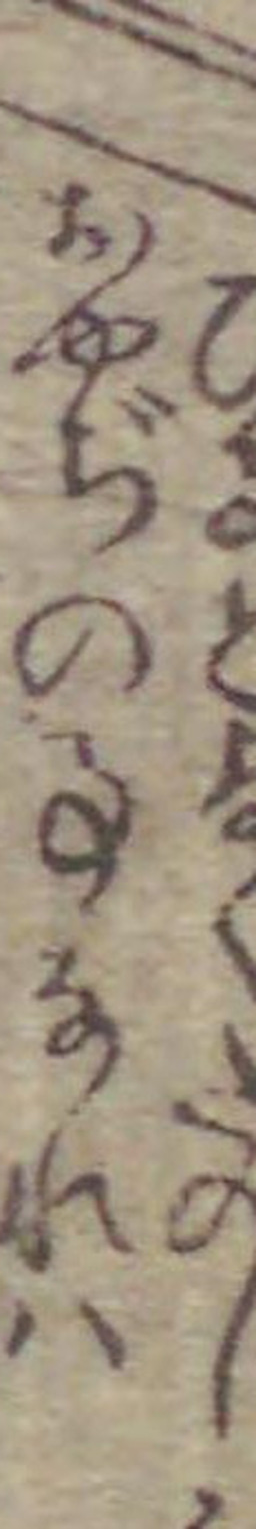おやぢの事なれは
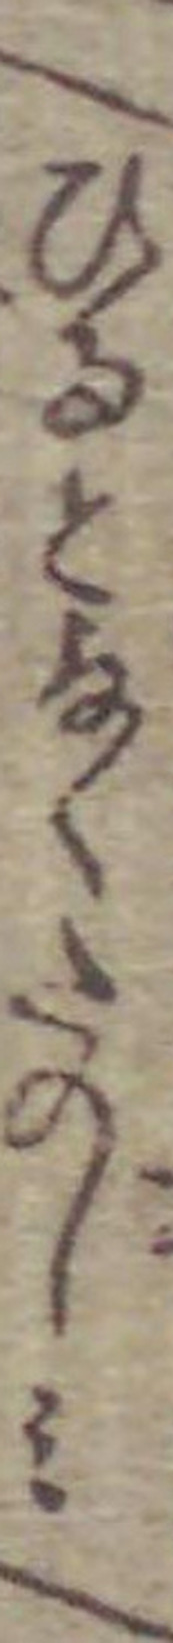ひるとなくたのしみ
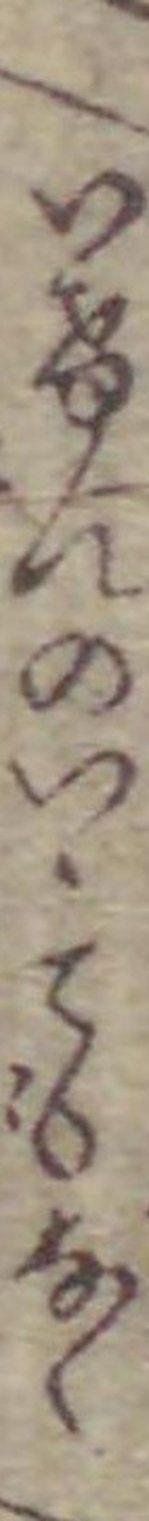いけんのいゝてもなく
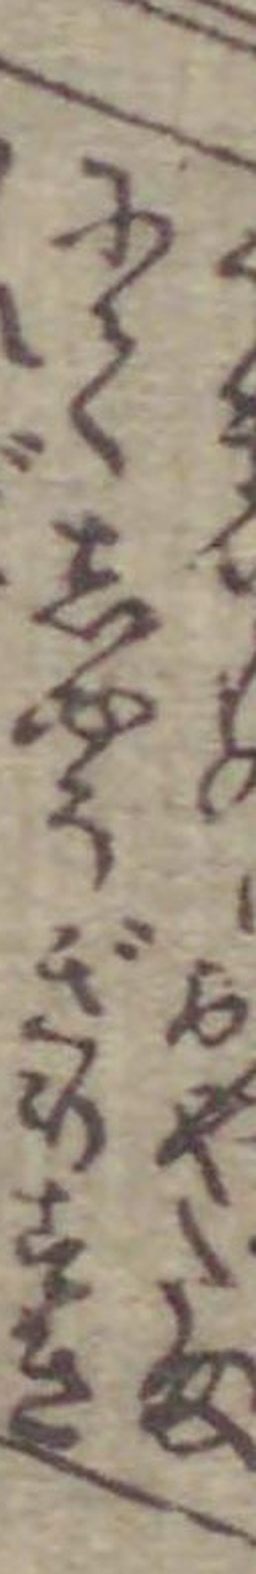にてしやうぎもすき
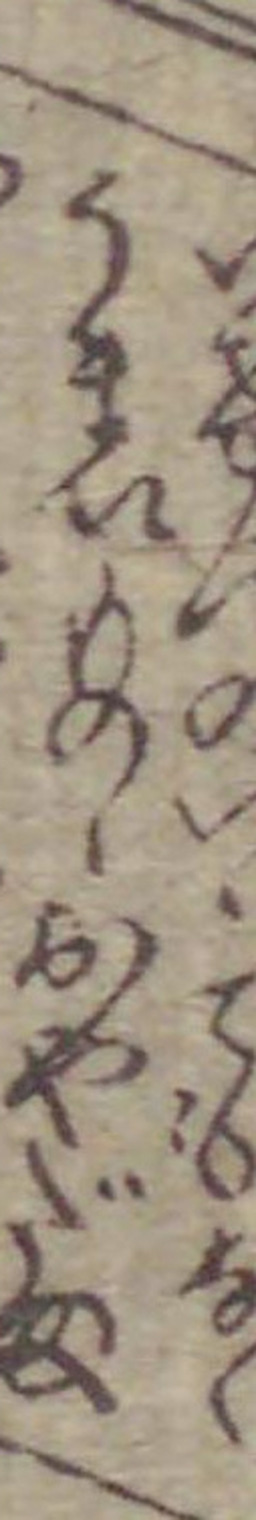うまいものゝおやだま
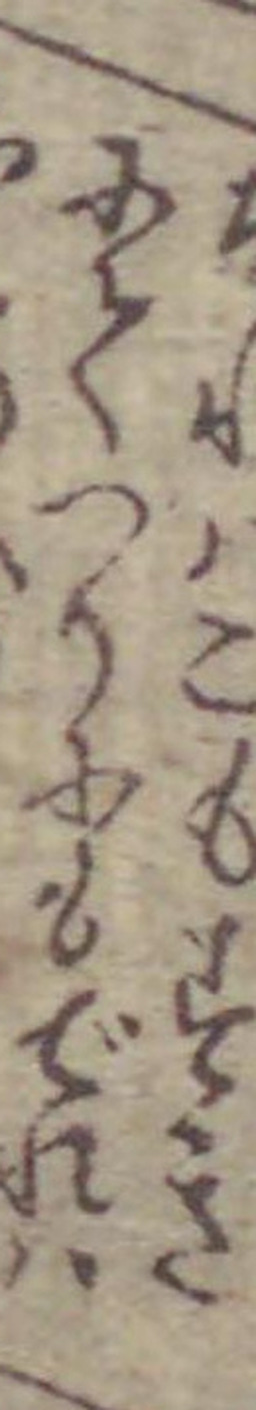にてつりにもでれは
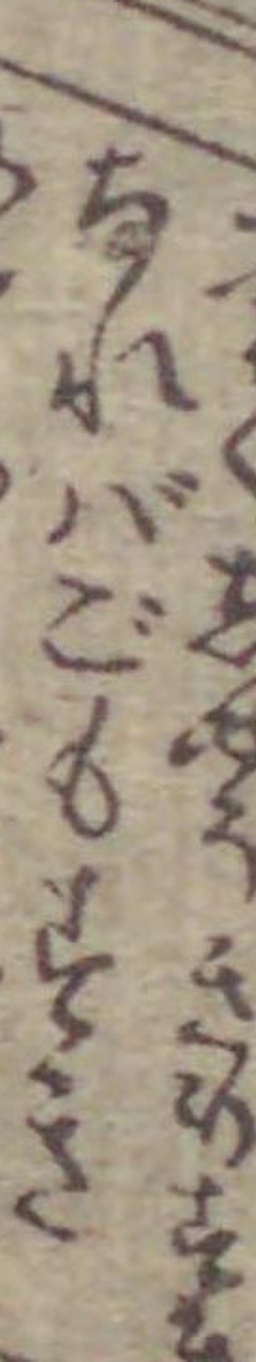なればごもすき
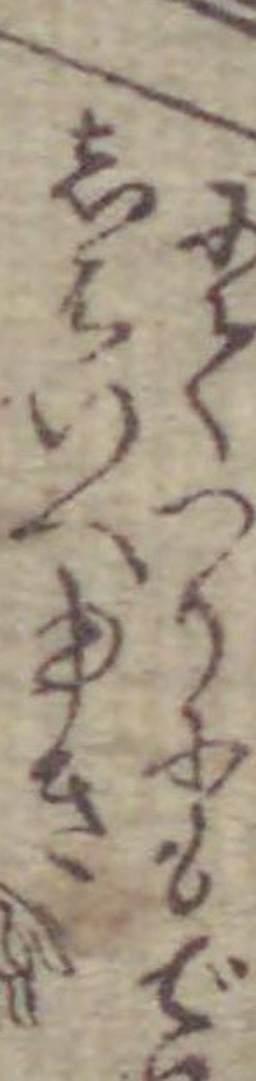しはいへゆき
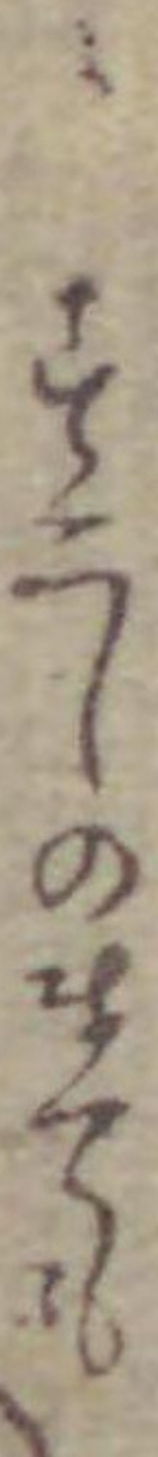すこしのまても
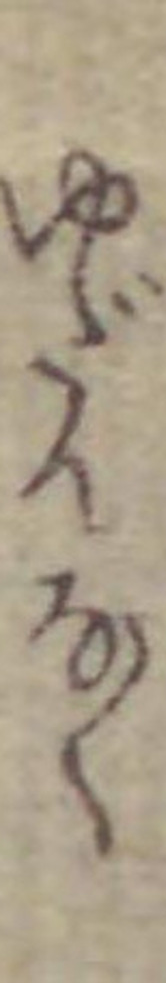ゆだんなく
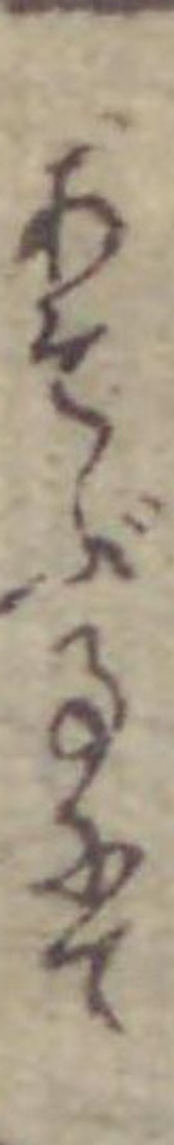あそぶ事にて
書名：親父布子鳶握 3巻
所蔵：国立国会図書館 National Diet Library, JAPAN
